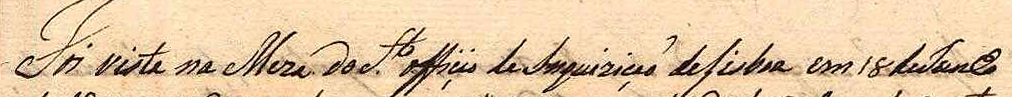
Foi vista na Meza do S.to officio de Inquiziçaõ de Lisboa em 18 de Iunho
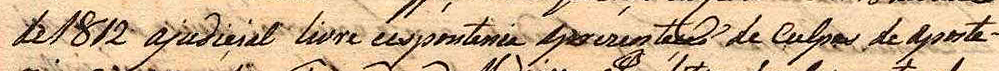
de 1812 a judicial livre e espontania aprezentaçaõ de culpas de aposta
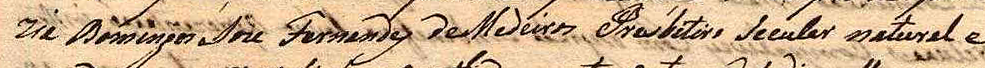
zia Domingos Ioze Fernandes de Medeiros Presbetiro secular natural e
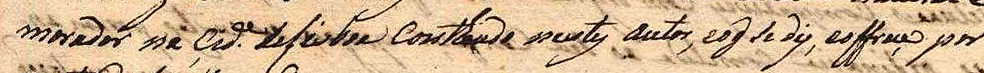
morador na cid.e de Lisboa contheudo nestes autos, e o q̄ se dis, e offrece por
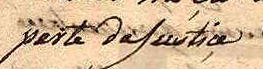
parte da Justiça
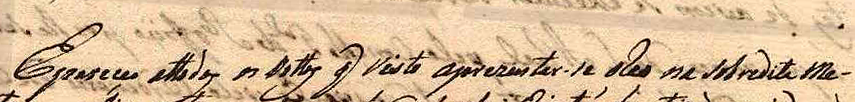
E pareceo a todos os vottos q̄ visto aprezentar-se o Reo na sobredita me
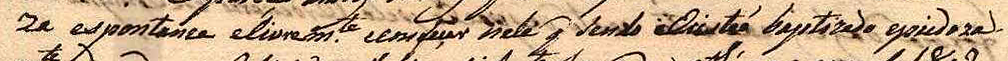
za espontanea e livrem.te e confeçar nela q̄ sendo christaõ baptizado e piedoza
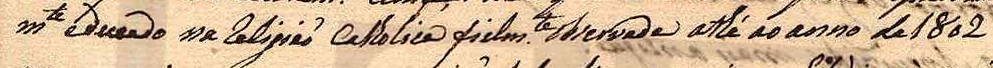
m.te educado na Religiaõ Catholica fielm.te observada athé ao anno de 1802
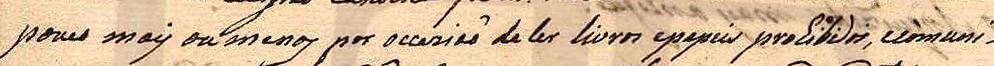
pouco mais ou menos por occaziaõ de ler livros e papeis prohibidos, e comuni
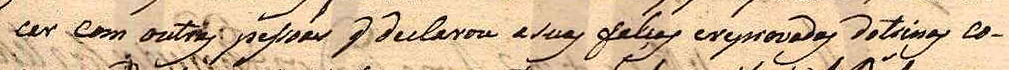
car com outras pessoas q̄ declarou a suas falças e reprovadas dotrinas co
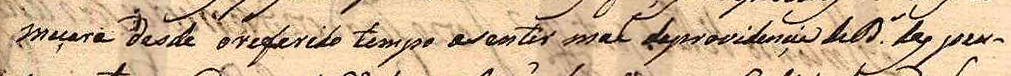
meçara desde o referido tempo a sentir mal da providencia de D.s das pen
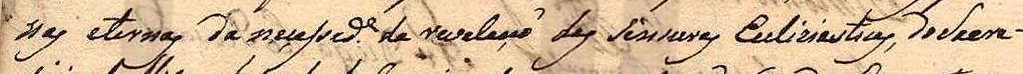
nas eternas da necessed.e de revelaçaõ das sensuras Eccliziasticas, do Sacre
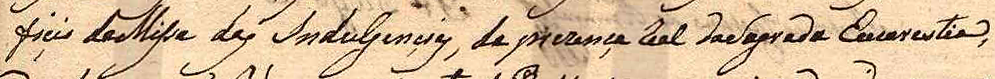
ficio da Missa das Indulgencias, da prezença Real da Sagrada Eucarestia,
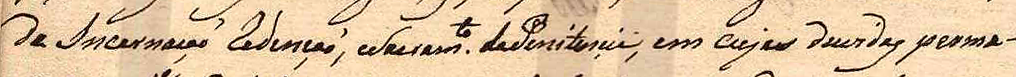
de Incarnaçaõ Redençaõ, e Sacram.to da Penitencia, em cujas duvidas perma
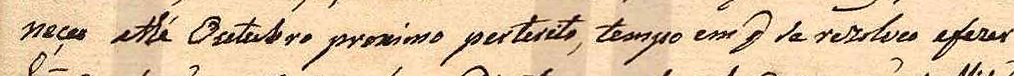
neceo athé Outubro proximo perterito, tempo em q̄ se rezolveo a fazer
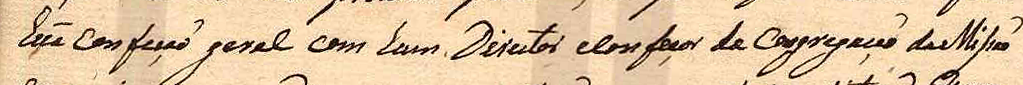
huā confiçaõ geral com hum Director e confeçor da Congregaçaõ da Missaõ
